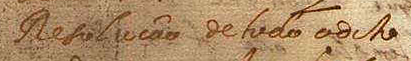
Resolução de todo o dito
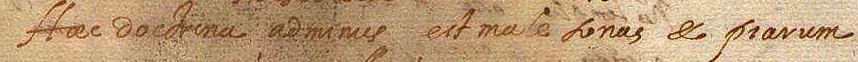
Hæc doctrina ad minus est male sonus & piarum
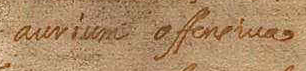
aurium offensiua
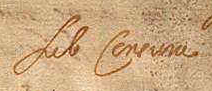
Sub Censura
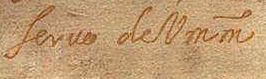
Seruo de V mm̄
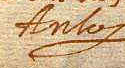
AnIos
